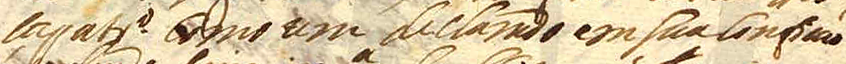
Çapatro. como tem declarado em sua conficaõ
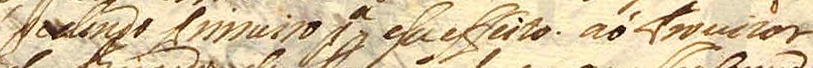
pedindo primeiro pa. esse effeito ao Prouizor
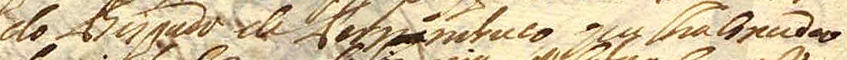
do Bispado de Pernambuco que lha concedece
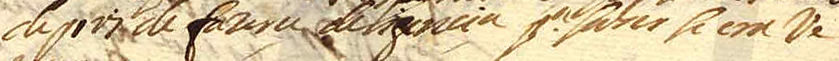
depois de fazerçe deligencia pa. saber se era ve
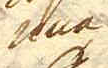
uua
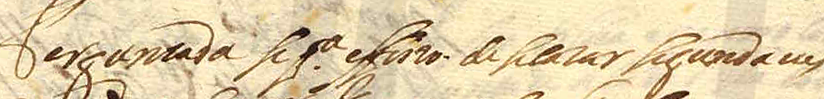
Perguntada se p.a effeito de se cazar segunda ues
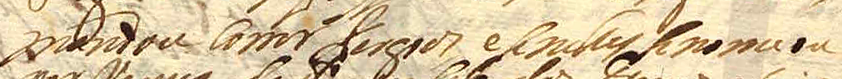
mandou correr pregoes, e se nelles se nomeou
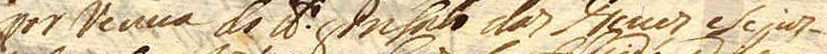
por Veuua do d̄.o gonsalo das Neues, e se jus
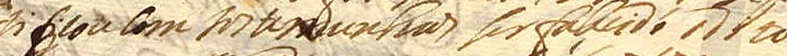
tificou com testemunhas ser faleçido o dito
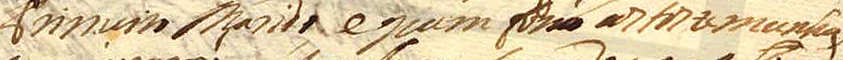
Primeiro Marido, e quem forão as testemunhas
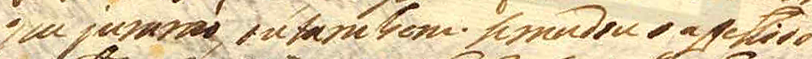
que juraraõ, ou tambem se mudou o apellido
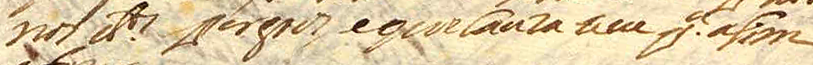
nos d̄.os pergoes, e que cauza teue p.a asim
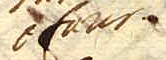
o fazer.
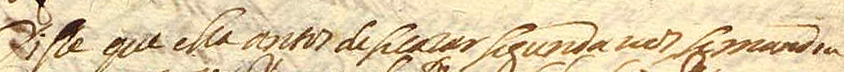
Disse que ella antes de se cazar segunda uez se mandou
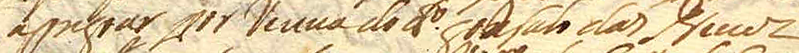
apregoar por Veuua do d̄o. gonsalo das Neuez
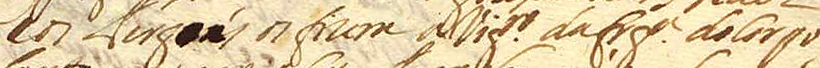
e os Pergoes os fizera a Vig.ro da frg.a do Corpo
